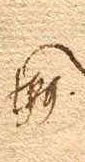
tp̄ꝯ.
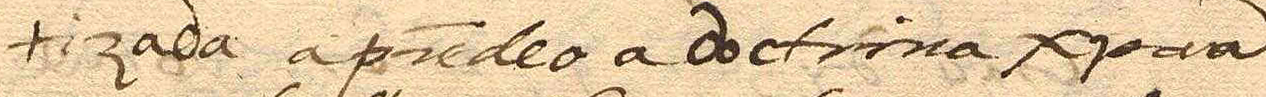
tizada aprēdeo a doctrina xpaā
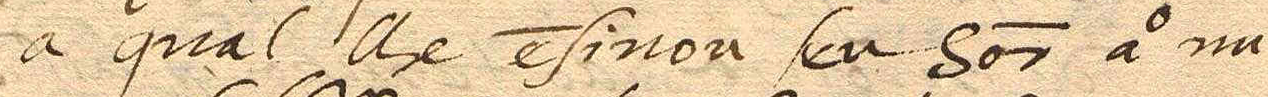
a qual lhe ēsinou hu sōr ao nu
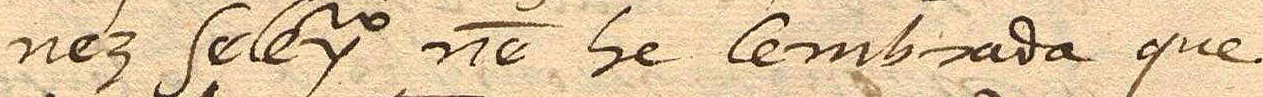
nez seleyro nē he lembrada que
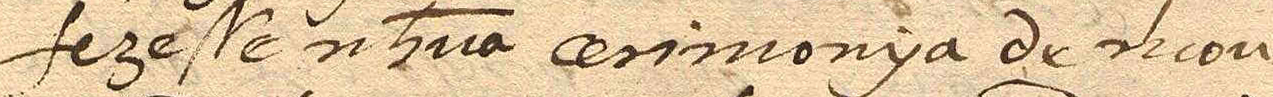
fezesse nhūa cerimonya de mou
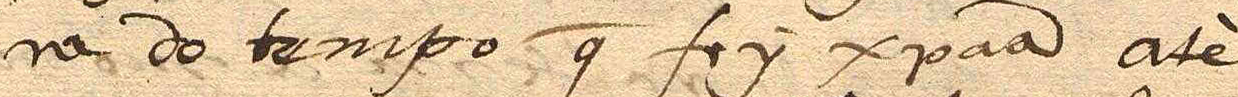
ra do tempo q̄ foy xpāa até
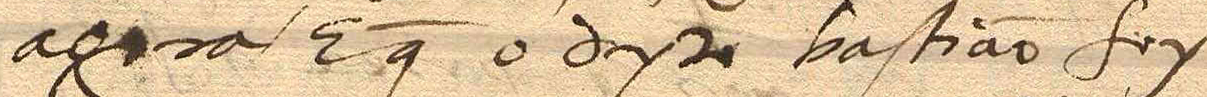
agora / E q̄ o dyto bastião foy
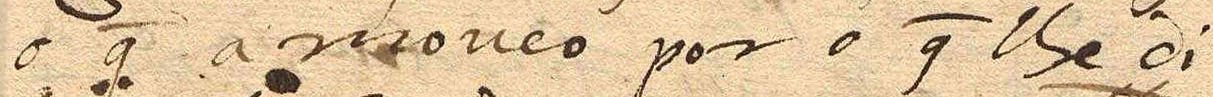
o q̄ a moveo por o q̄ lhe di
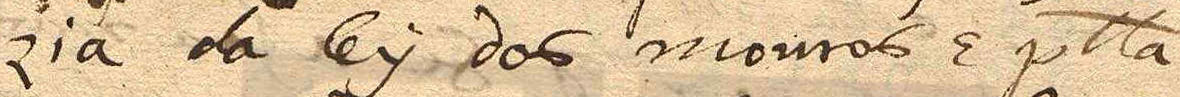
zia da ley dos mouros E p̄lla
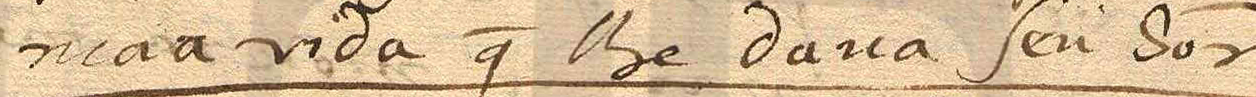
maa vida q̄ lhe daua seu sōr
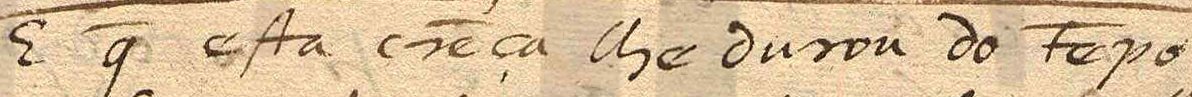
E q̄ esta crēça lhe durou do tēpo
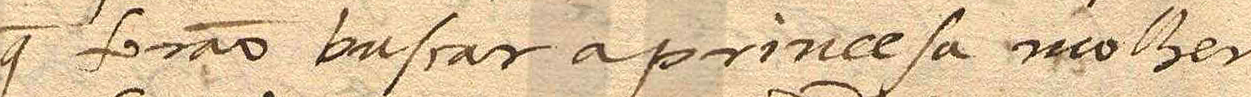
q̄ forão buscar a princesa molher
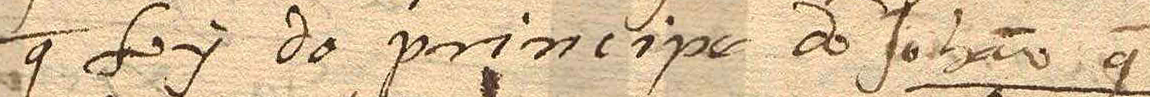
q̄ foy do principe dō Johão q̄
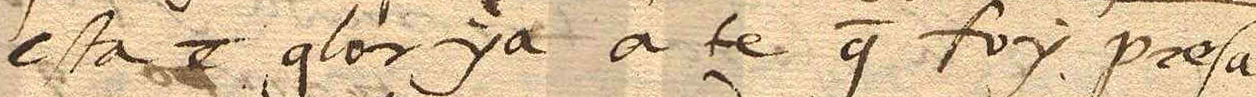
esta ē glorya ate q̄ foy presa
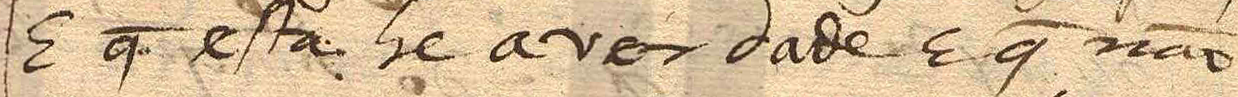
E q̄ esta he a verdade E q̄ não
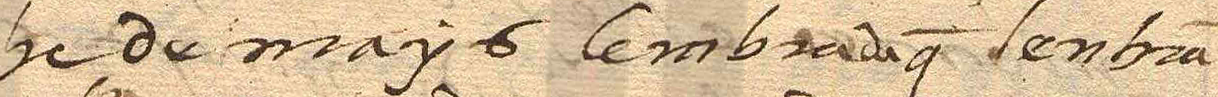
he de mays lembrada q̄ lenbrā
